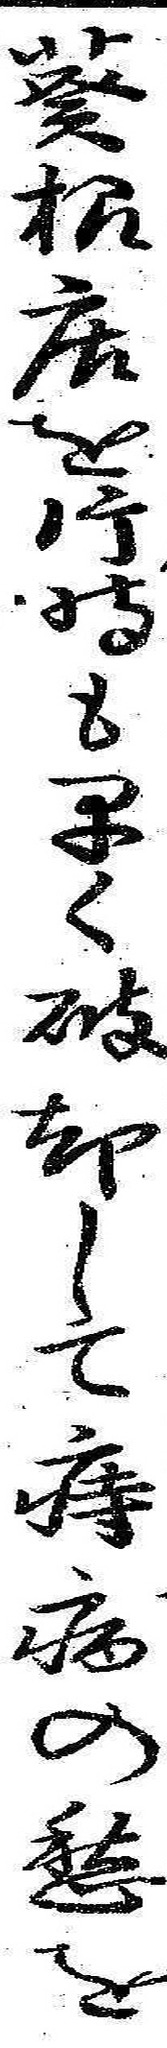葵根店を片時も早く破却して痔病の愁を
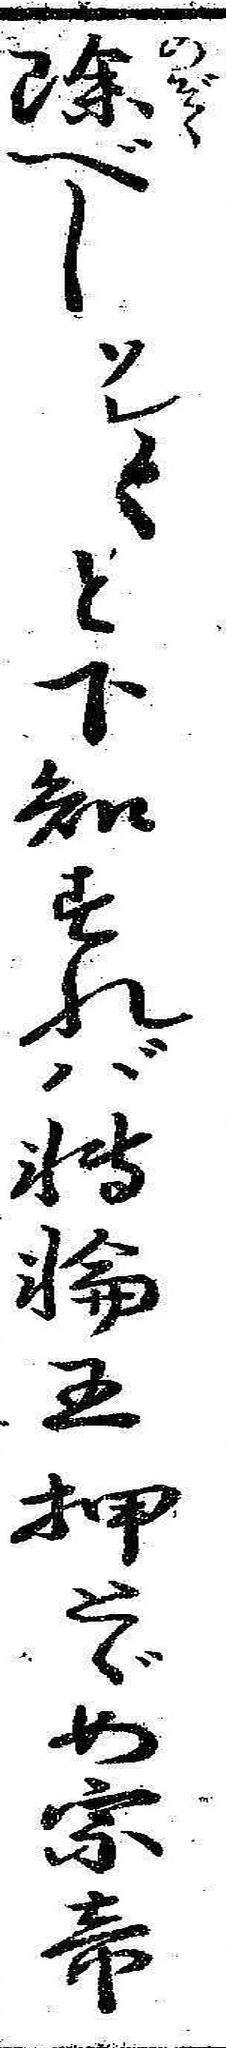除べしソレ〳〵と下知すれば転輪王押とゞめ宗帝
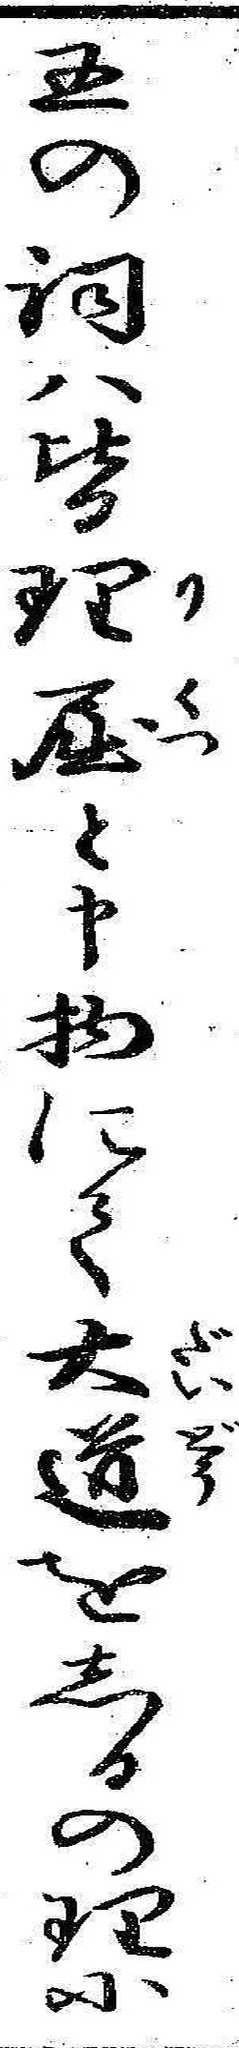王の詞は皆理屈と申物にて大道をしるの理に
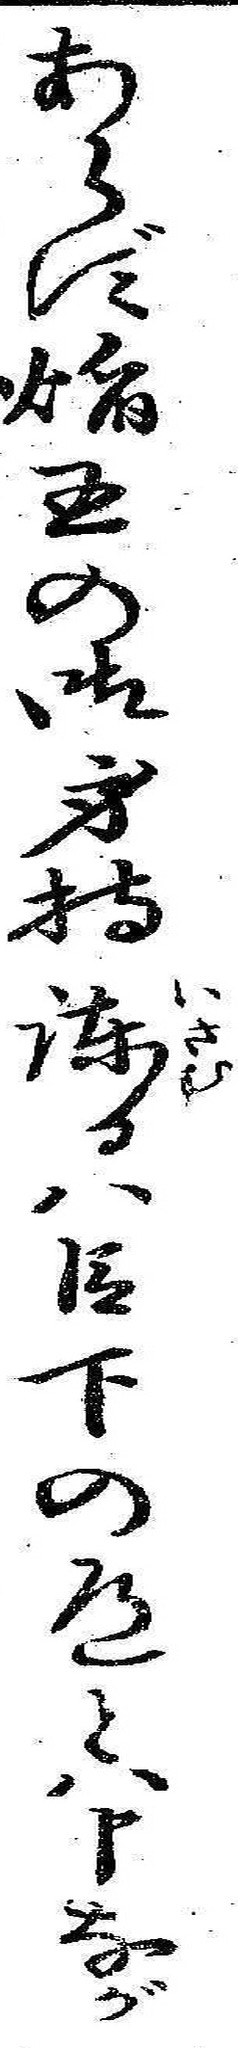あらずえん焔王の御身持諌るは臣下の道とは申なが
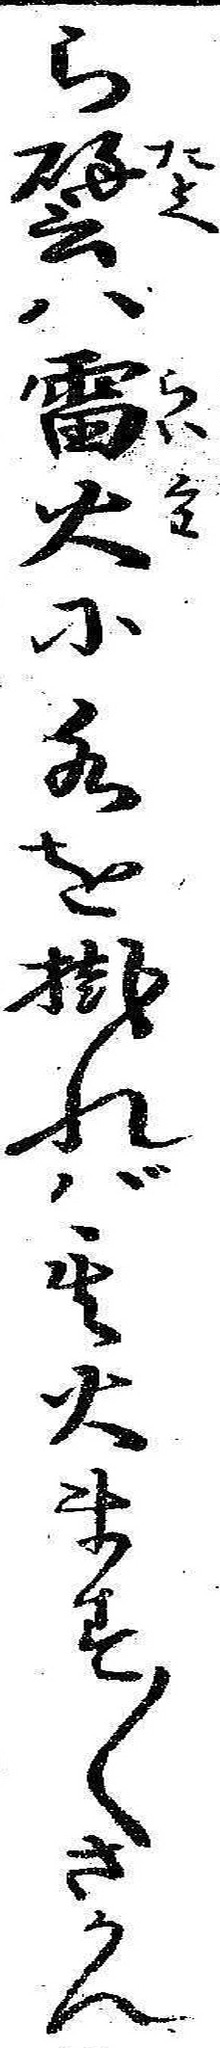ら譬は雷火に水を掛れば其火ます〱さかん
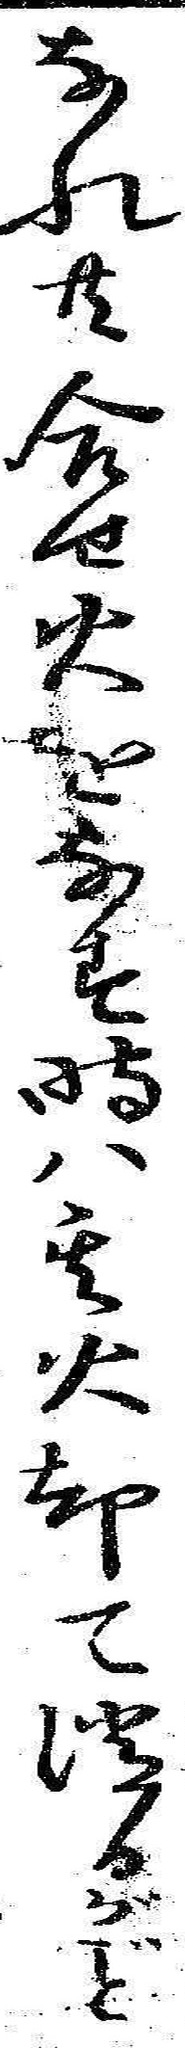なれ共合せ火をなす時は其火却て消るがごと
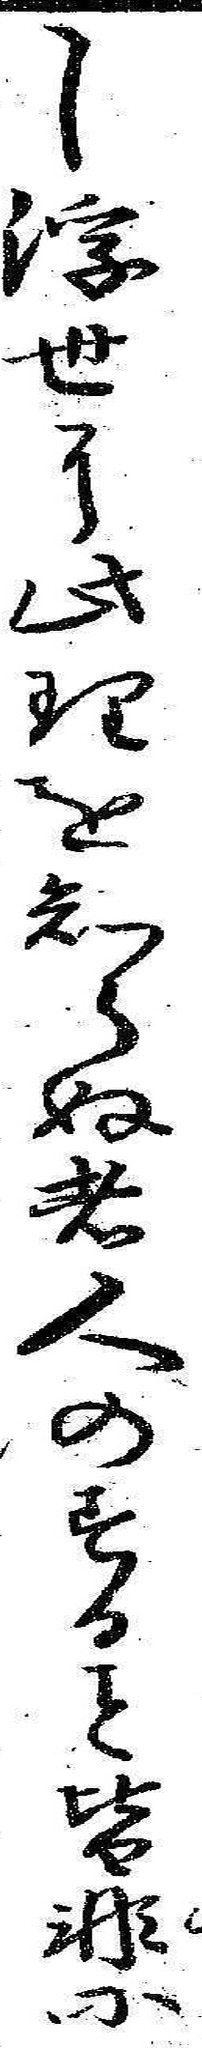し浮世に此理を知らぬ者人のすること皆非に

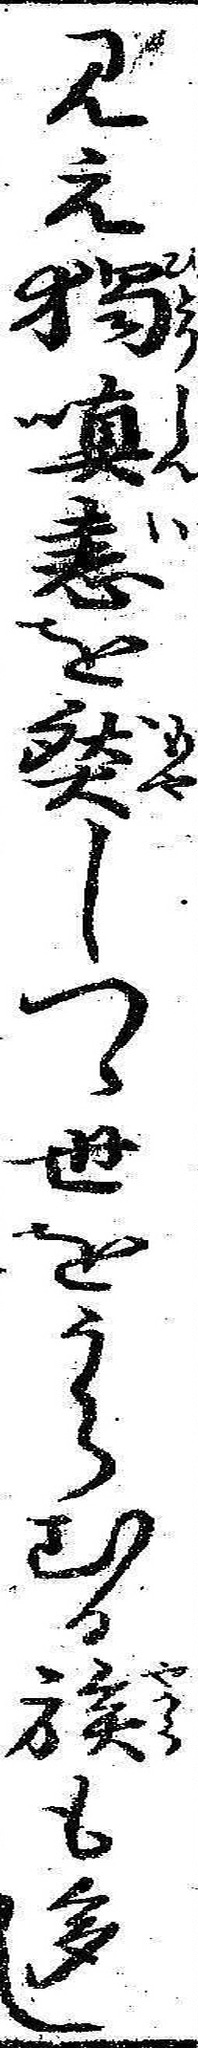見え独嗔恚を燃しつゝ世をうらむる族も多し
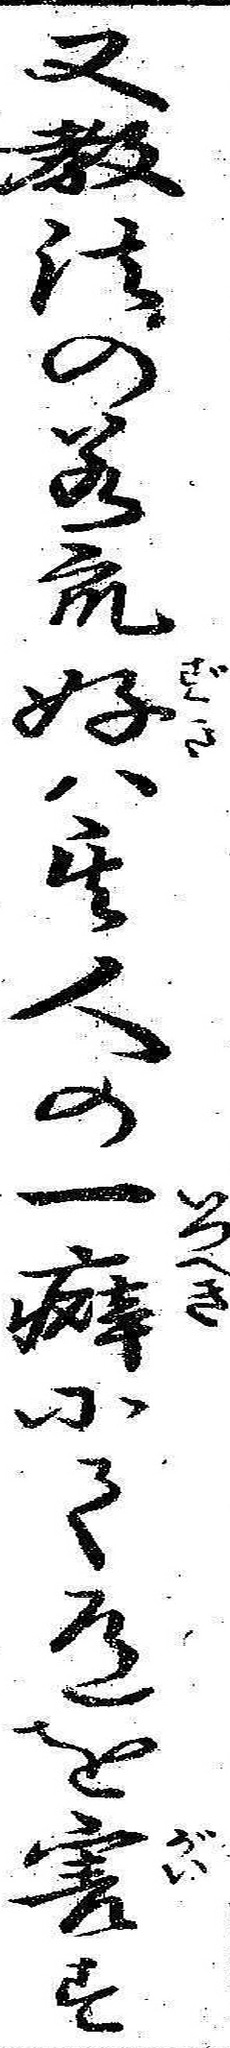又教法の若衆好は其人の一癖にて道を害す
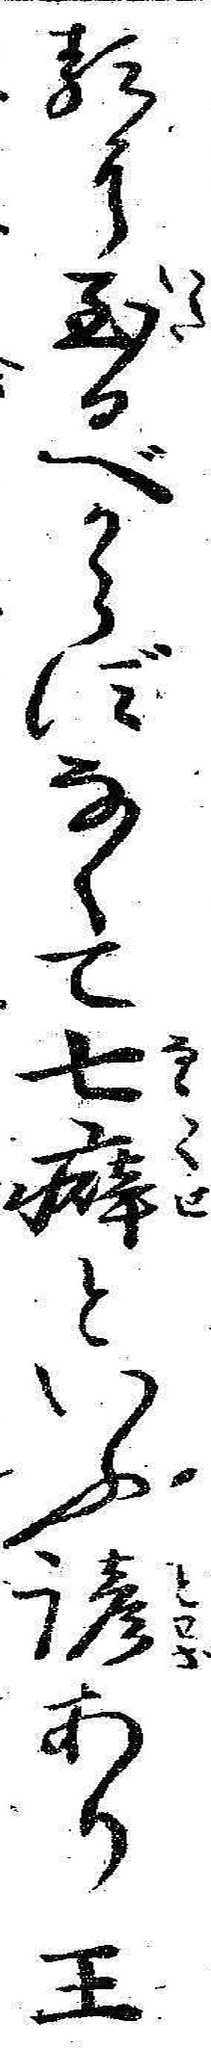るに至るべからずなくて七癖といふ諺あり王
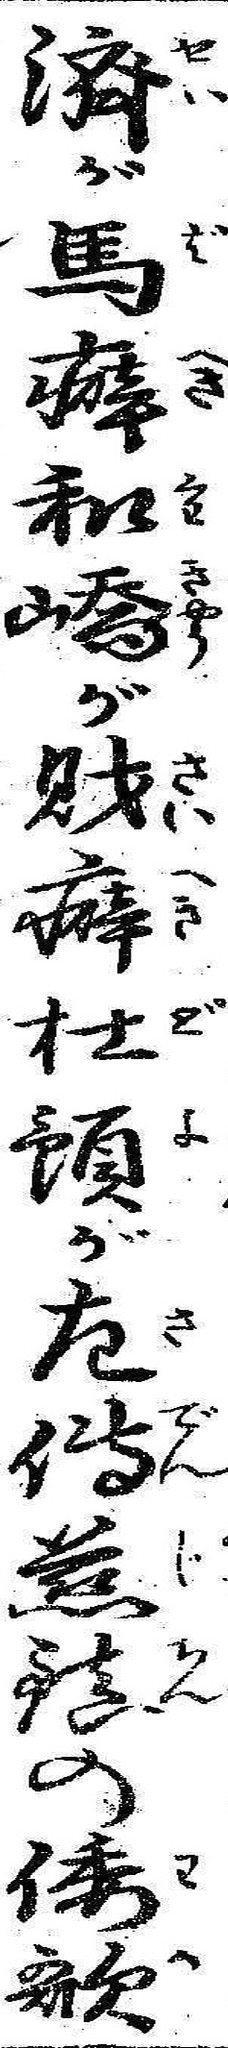済が馬癖和嶠が財癖杜預が左伝慈鎮の倭歌
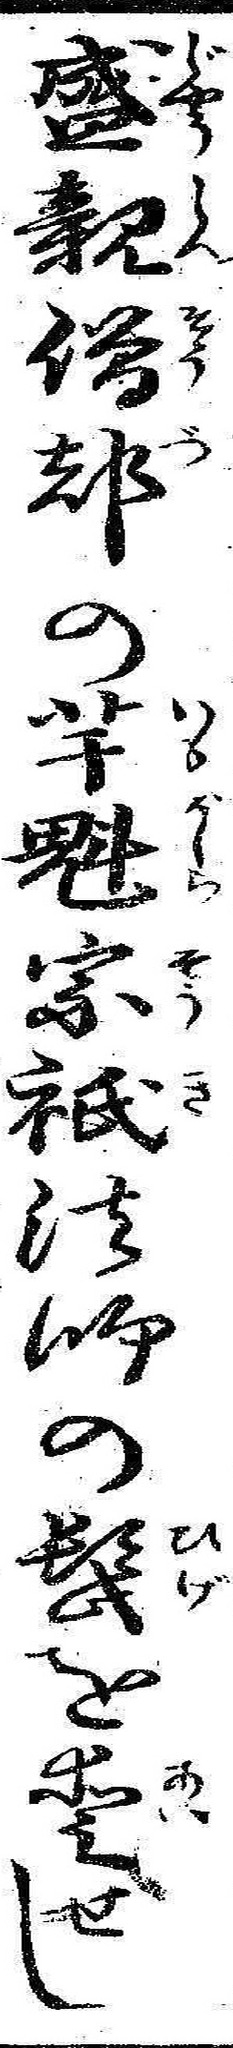盛親僧都の芋魁宗祇法師の髪を愛せし
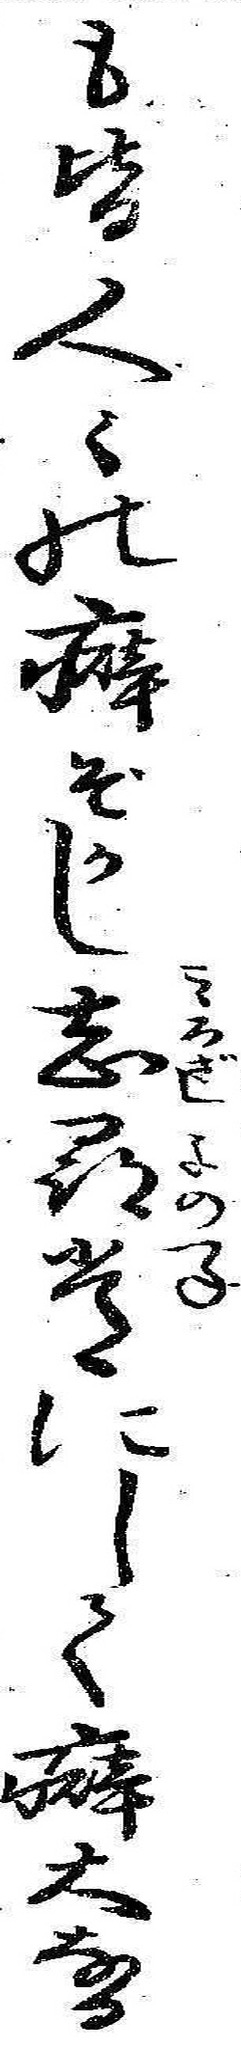も皆人々の癖ぞかし志尋常にして癖大なる
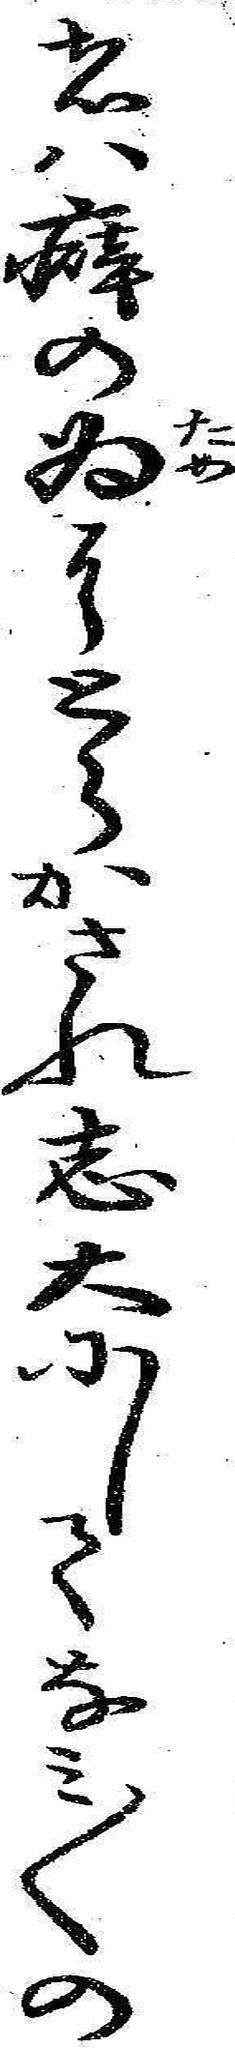者は癖の為にとろかされ志大にしてなみ〱の
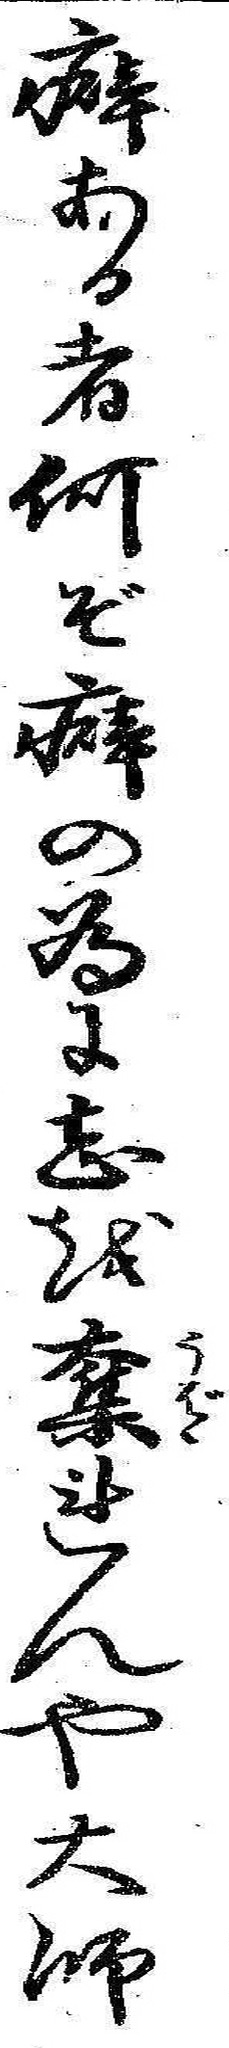癖ある者何ぞ癖の為に志を奪れんや大師
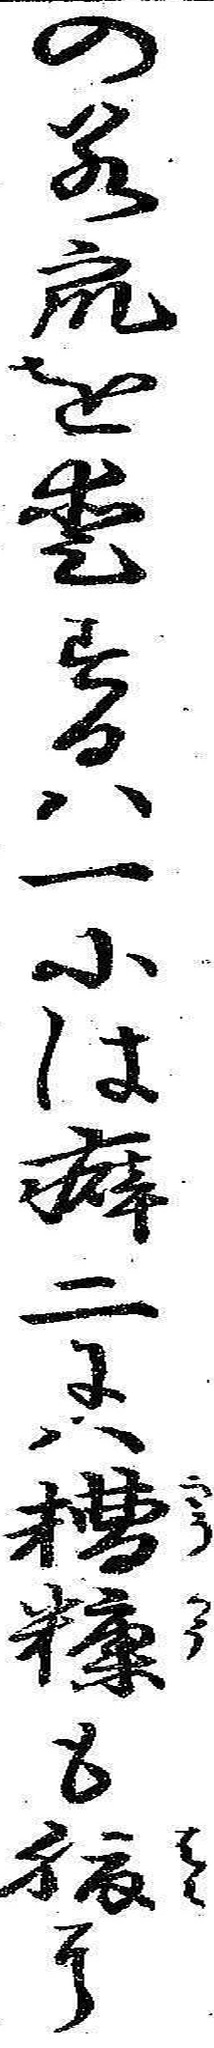の若衆を愛するは一には癖二には糟糠も腹に
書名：根無草後編
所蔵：国文学研究資料館
